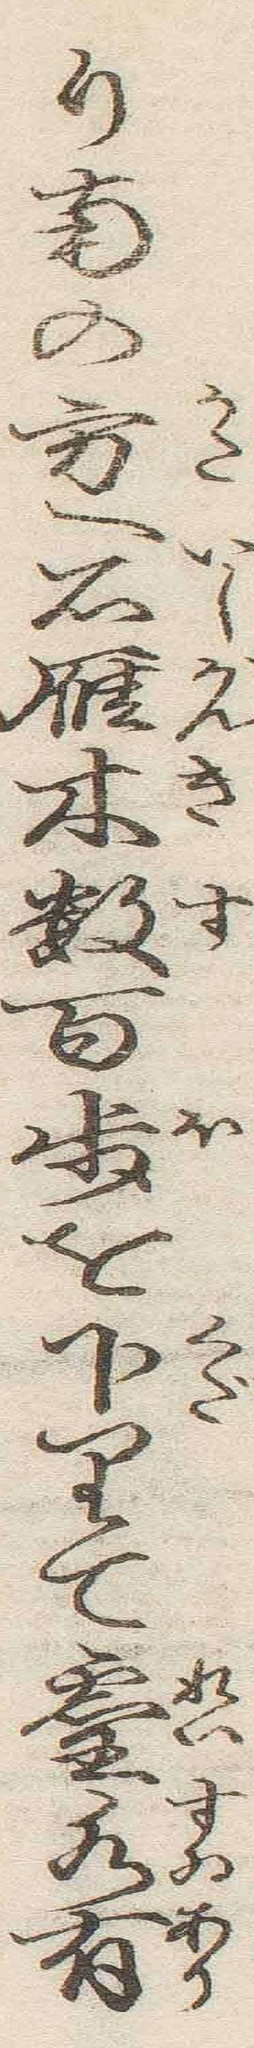り南の方へ石雁木数百歩を下りて靈水有
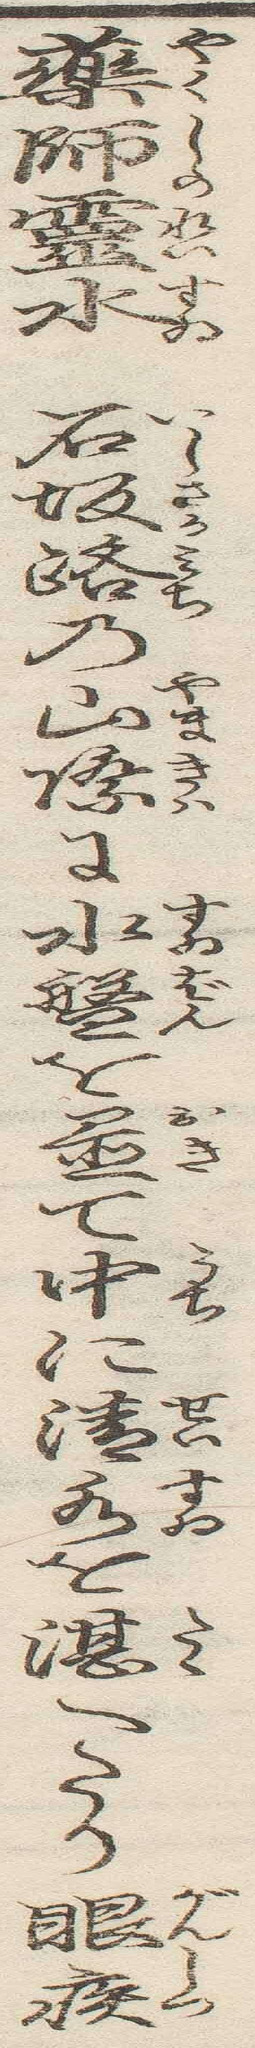藥師靈水石坂路の山際に水盤を置て中に清水を湛へたり眼疾
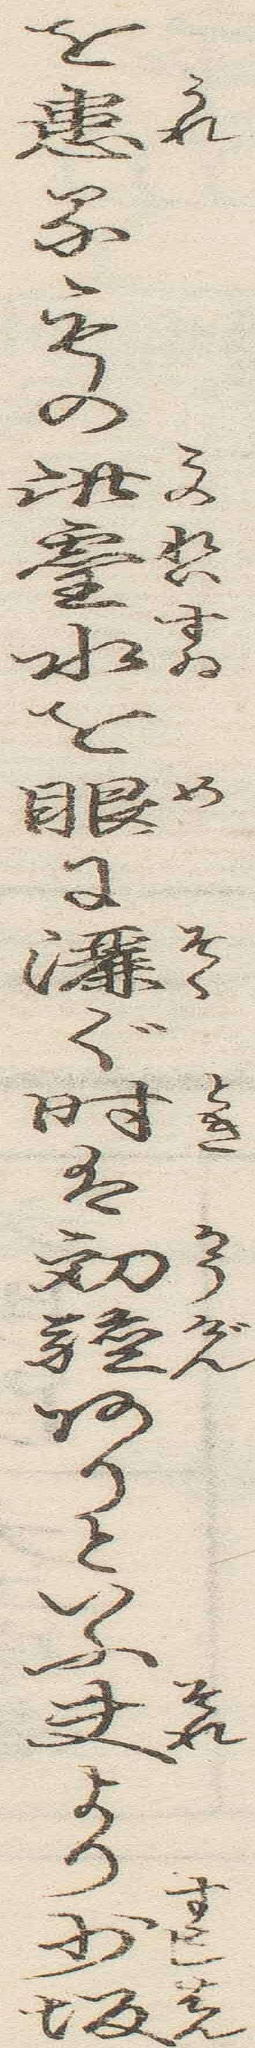を患るもの此靈水を眼に灑ぐ时は効驗ありといふ夫より少坂
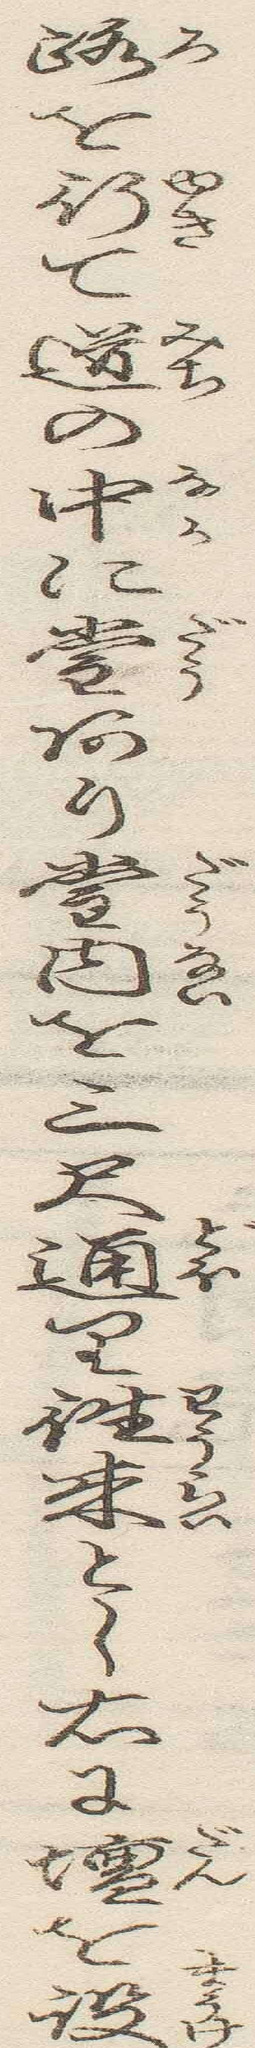路を行て道の中に堂あり堂内を三尺通り徃來とし右に壇を設
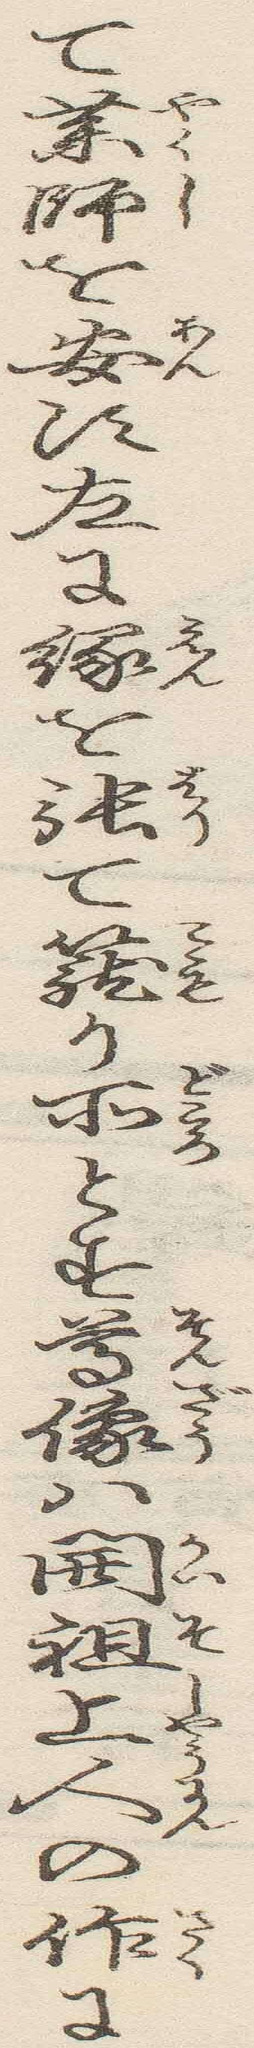て薬師を安す左に縁を張て籠り所とす尊像は開祖上人の作に
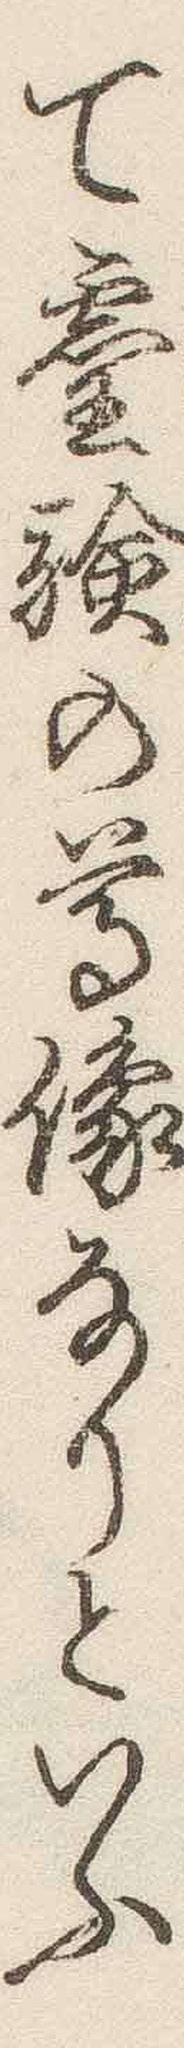て靈験の尊像なりといふ
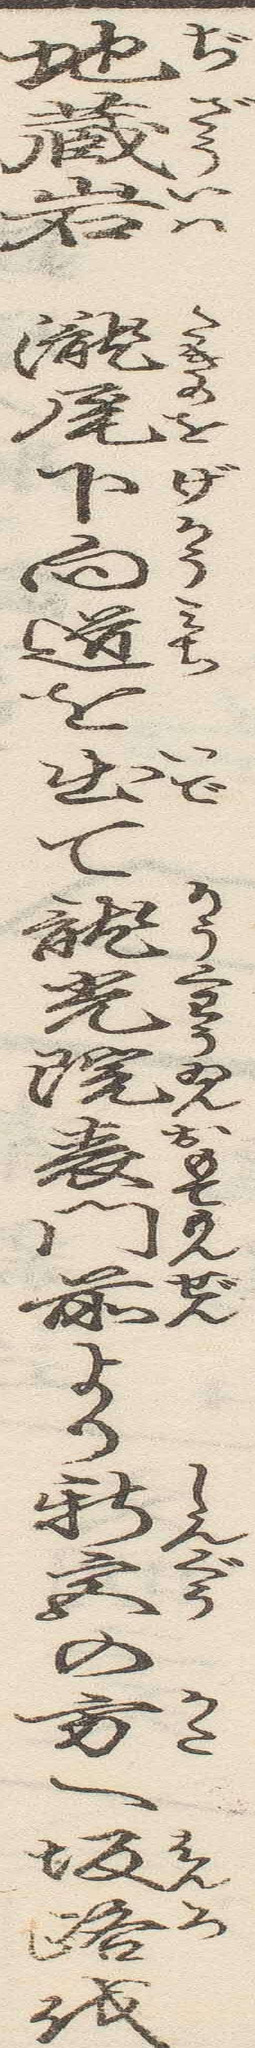地蔵岩瀧尾下向道を出て龍光院表門前より新宮の方へ坂路を
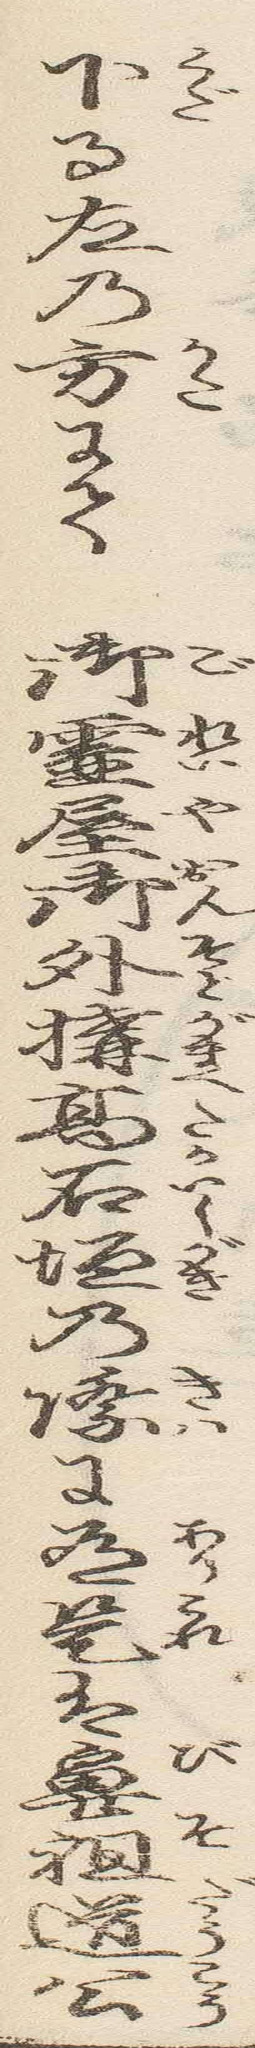下る左の方にて御靈屋御外構高石垣の際に有是は鼻祖道公
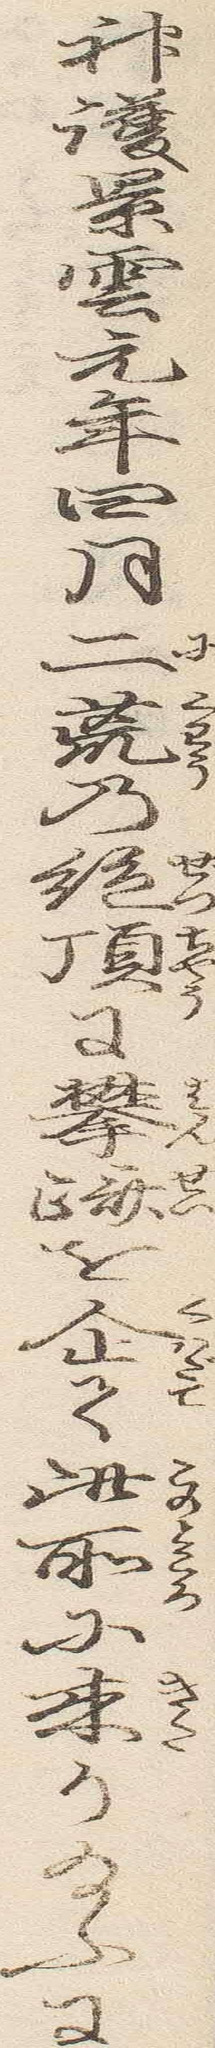神護景雲元年四月二荒の絶頂に攀跡を企て此所に來り給ふに
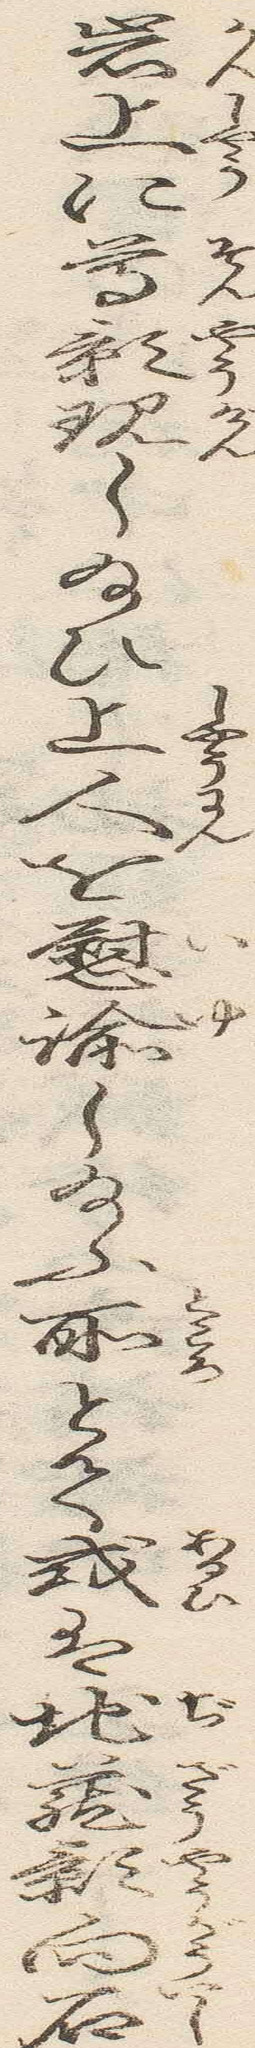岩上に尊影現し給ひ上人を慰諭し給ふ所とて或は地蔵影向石
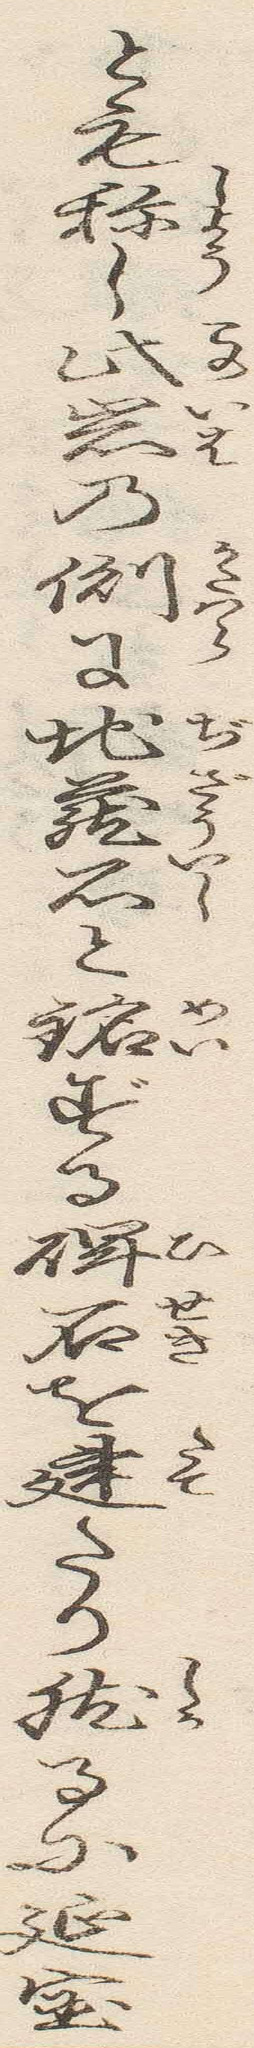とも称し此岩の側に地蔵石と銘ずる碑石を建たり然るに延宝
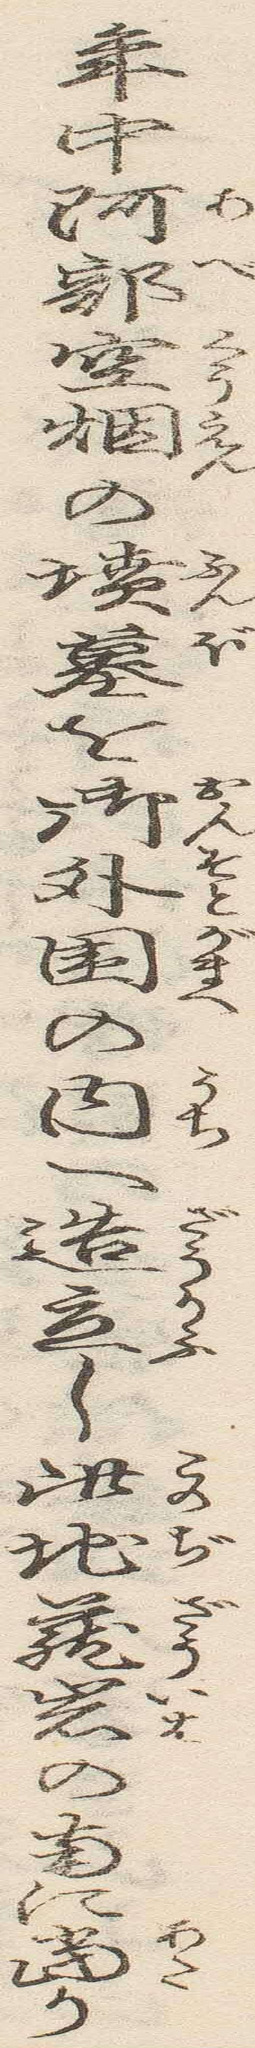年中阿部空烟の墳墓を御外圍の内へ造立し此地蔵岩の南に當り
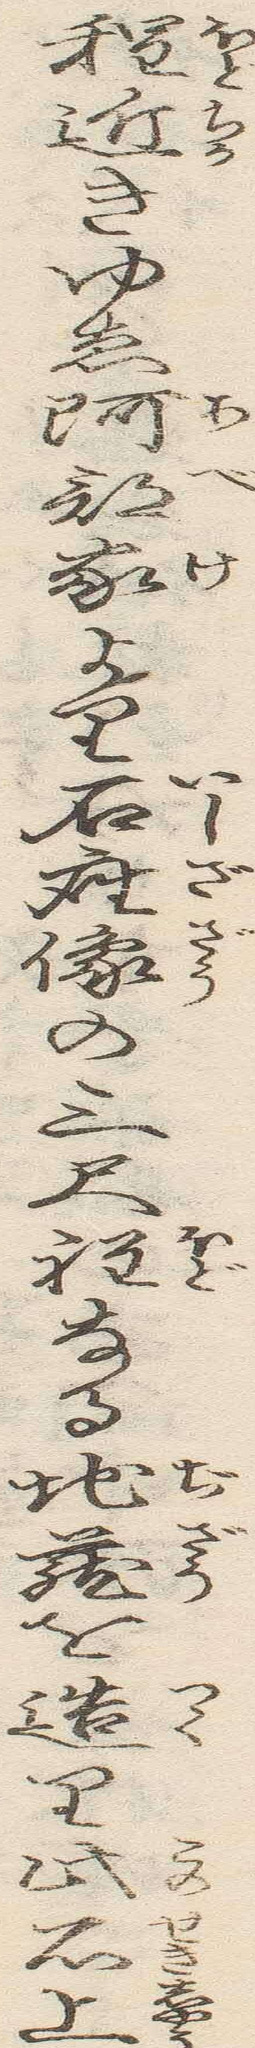程近きゆゑ阿部家より石座像の三尺程なる地蔵を造り此石上
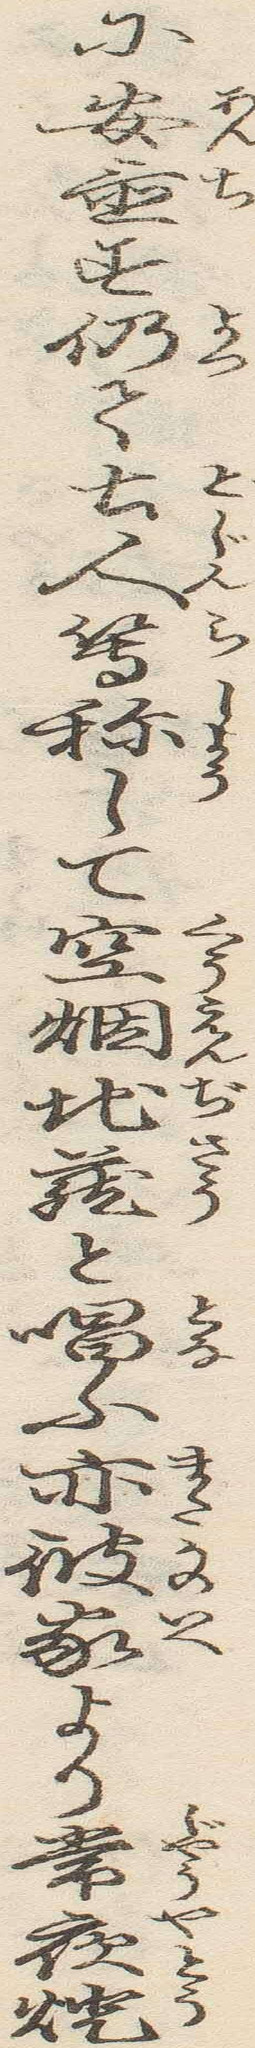に安置す仍て土人等称して空烟地蔵と唱ふ亦彼家より常夜燈
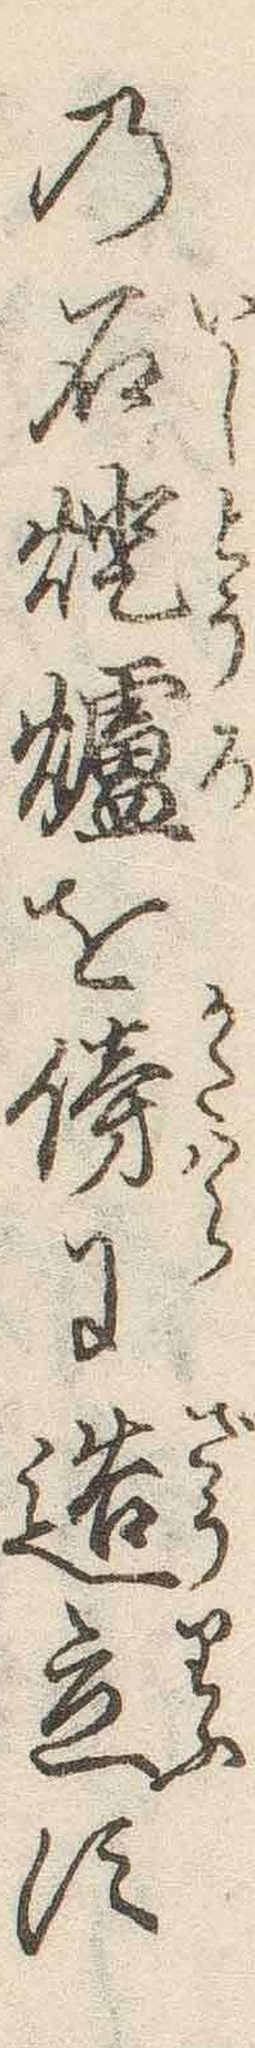の石燈爐を傍に造立す
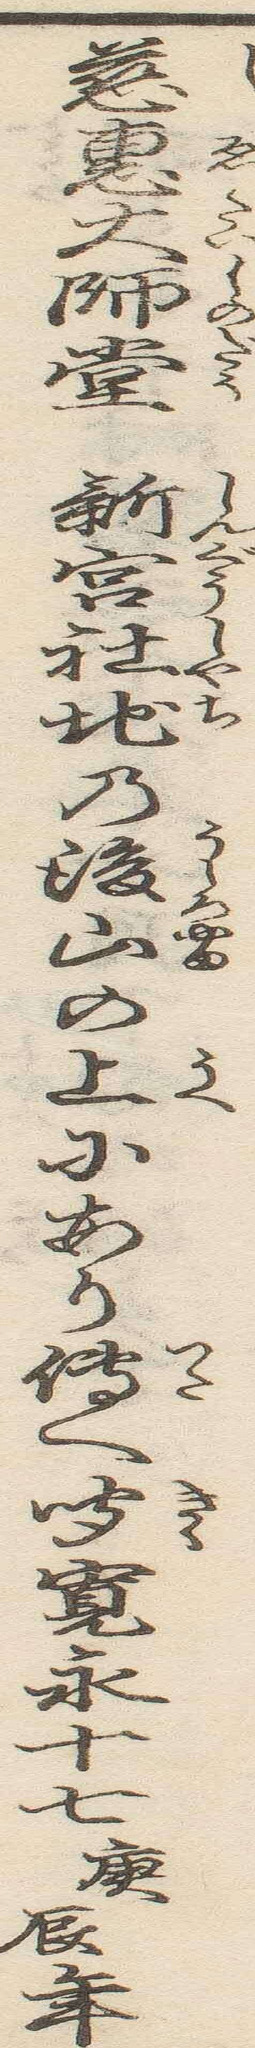慈惠大師堂新宮社地の後山の上にあり傳へ聞寛永十七庚辰年
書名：日光山志
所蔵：東京学芸大学附属図書館 国文学研究資料館
